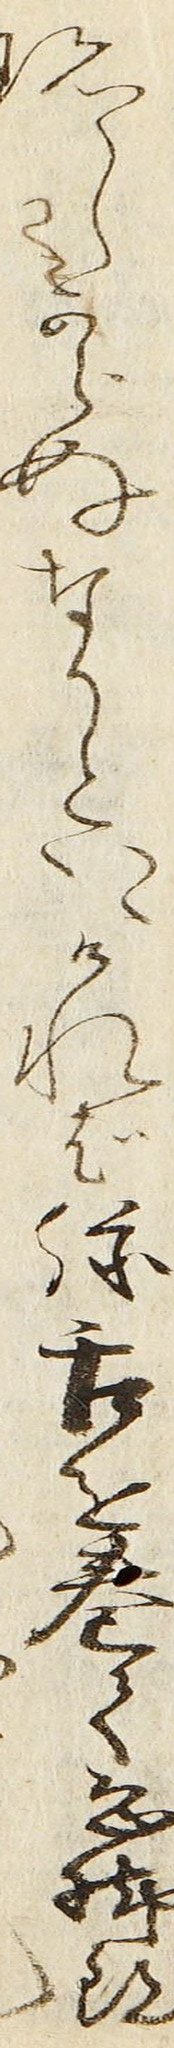珍しからぬなりといゝければ弥舌を巻て恐怖致
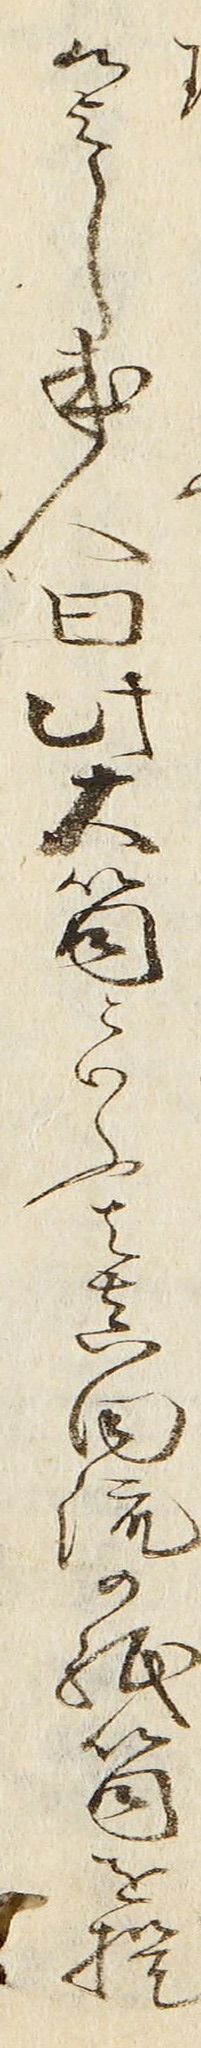候よし本人曰此大筒といふは真田流の紙筒を提
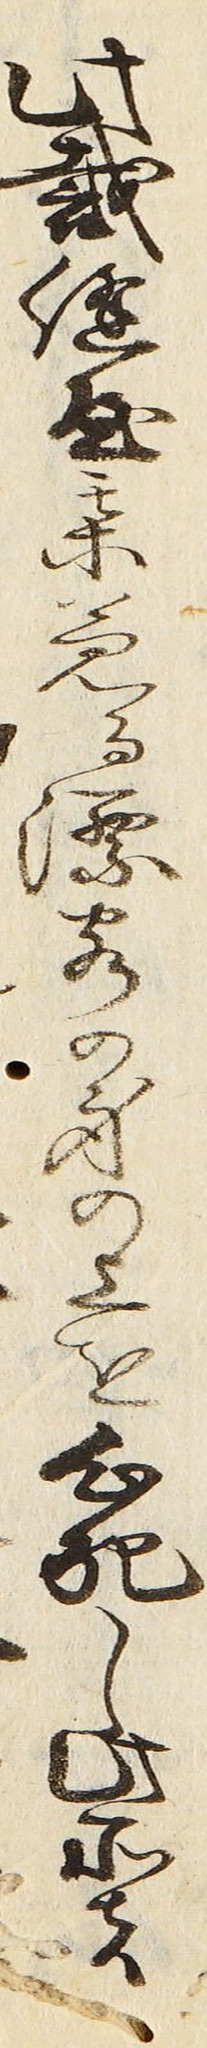此裁縫屋某兼而漂客の身の上を心配し此所は
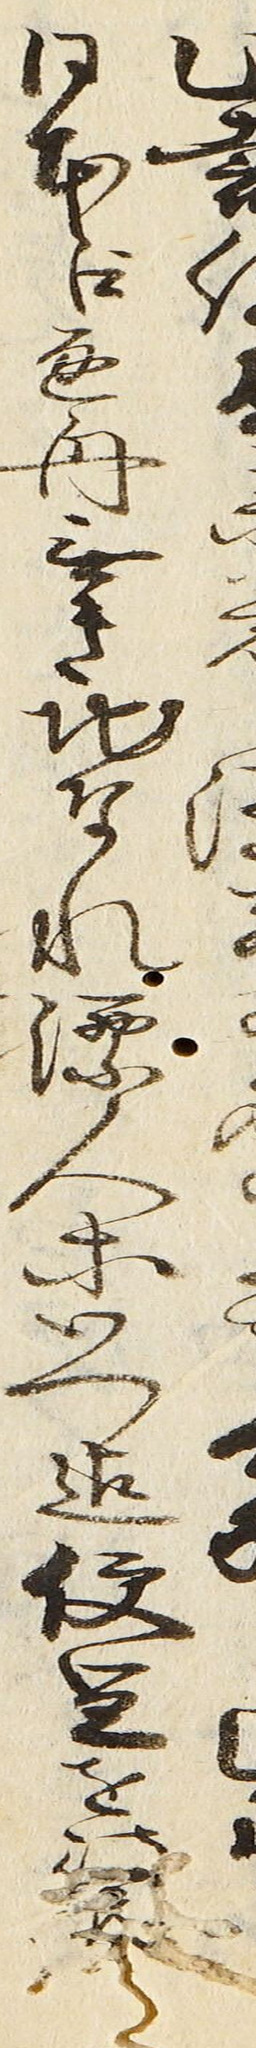日本え通舟無き地なれ漂人等いつ迄便宜を待
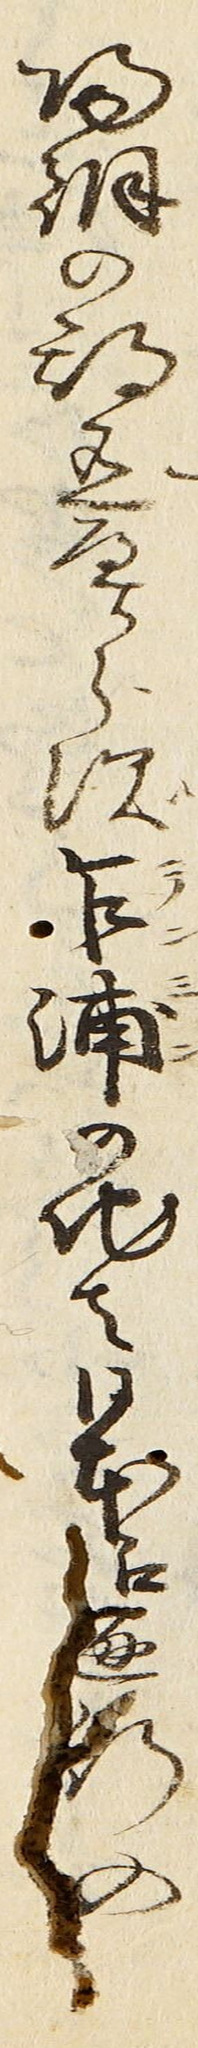帰朝の期有へからす乍浦の地は日本え通行の
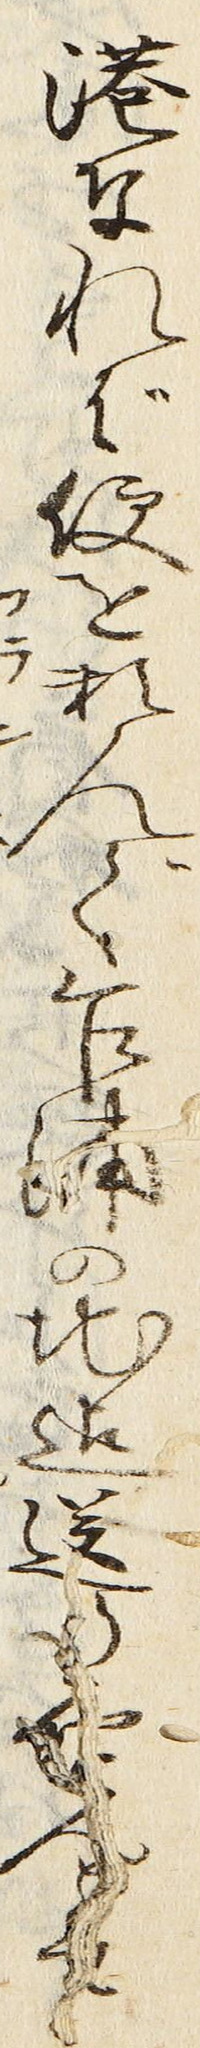港なれば便を頼んで乍浦の地迄送り届んとの由
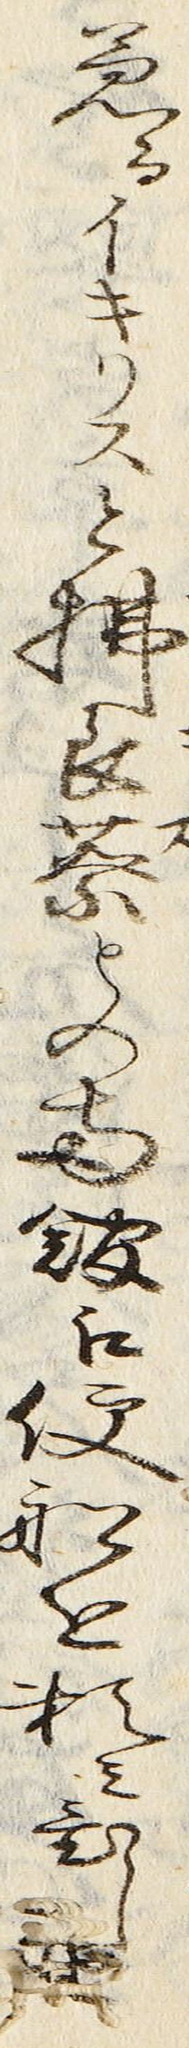兼而イキリスと払良蔡との両館え便船を頼ミ置し
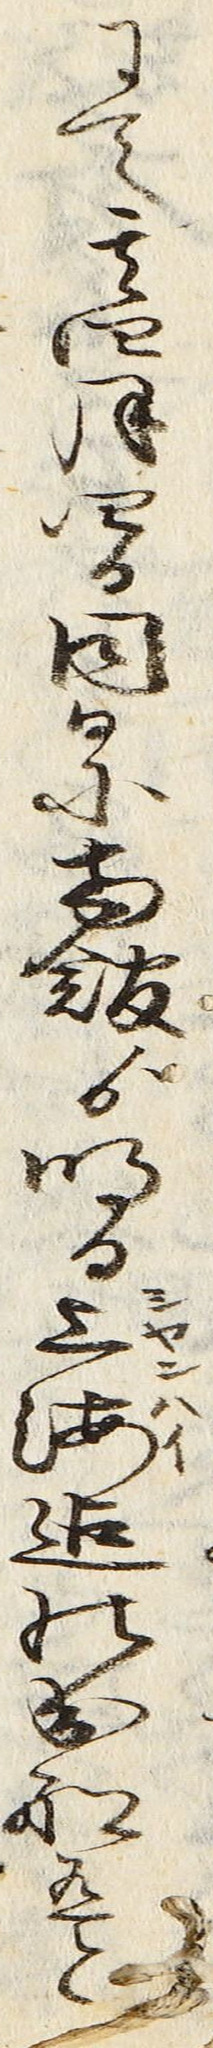にて其四月四日同日に両館ゟ明日上海迄の出船有と
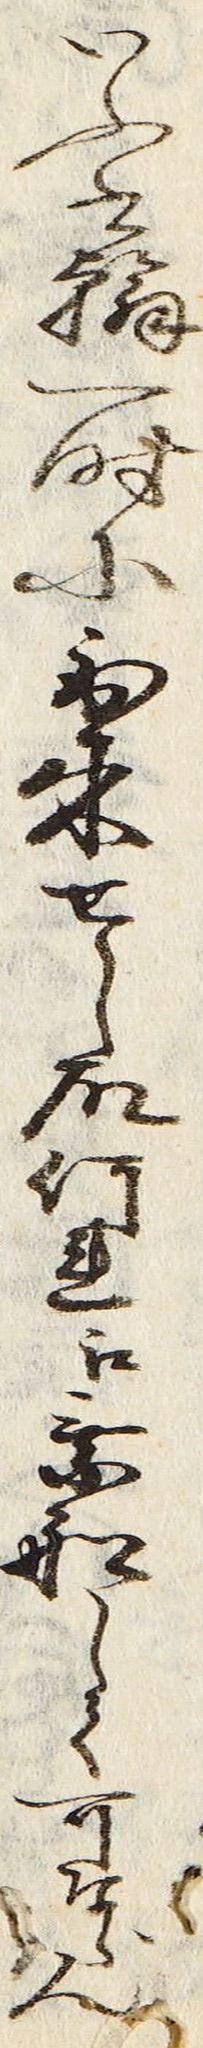いふ書翰一時に到来せし故何れえ乗船して可ならん
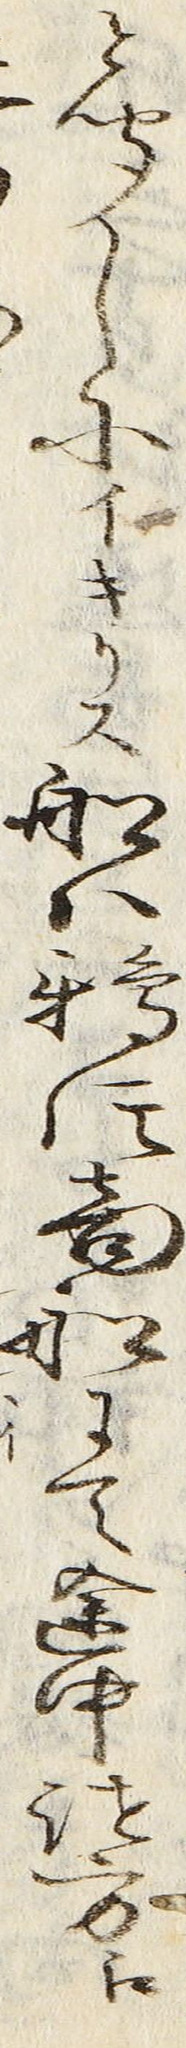と聞しにイキリス船ハ鴉片商船にて途中諸方え
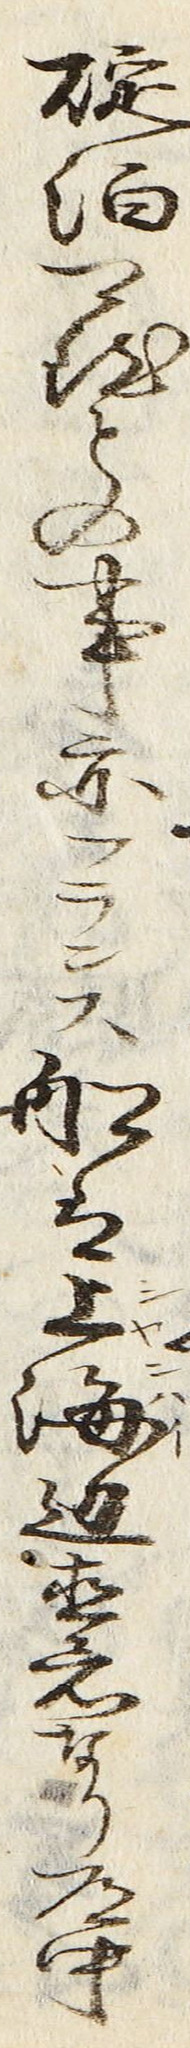碇泊可致との事亦フランス船は上海辺直着なり道中
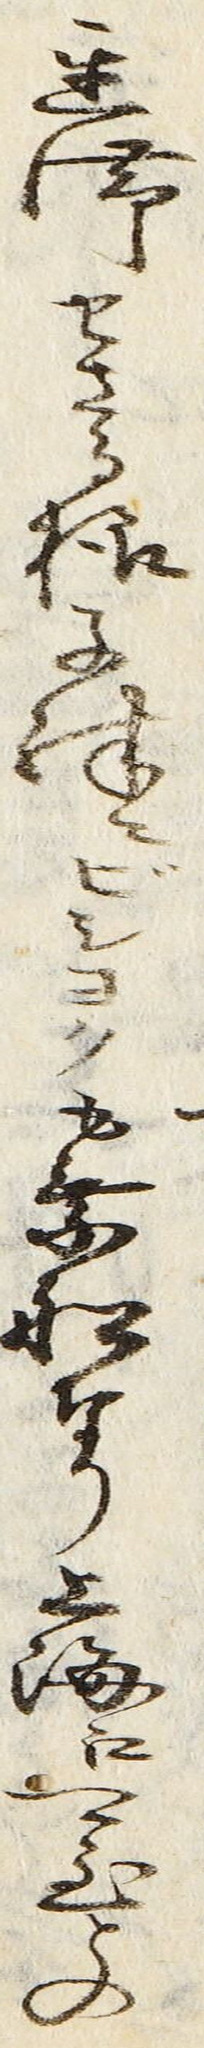遅滞セさる様子殊ニビシヨクも乗船なり上海え可至との
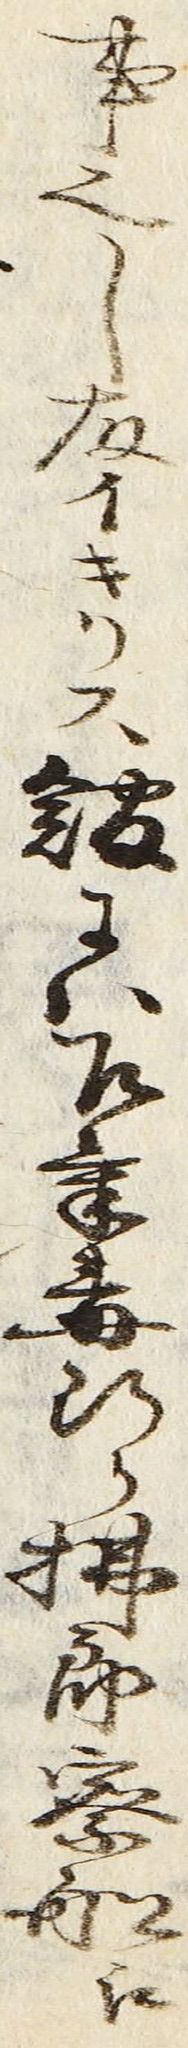事也し故イキリス館にハ乍気毒断り払郎察船江
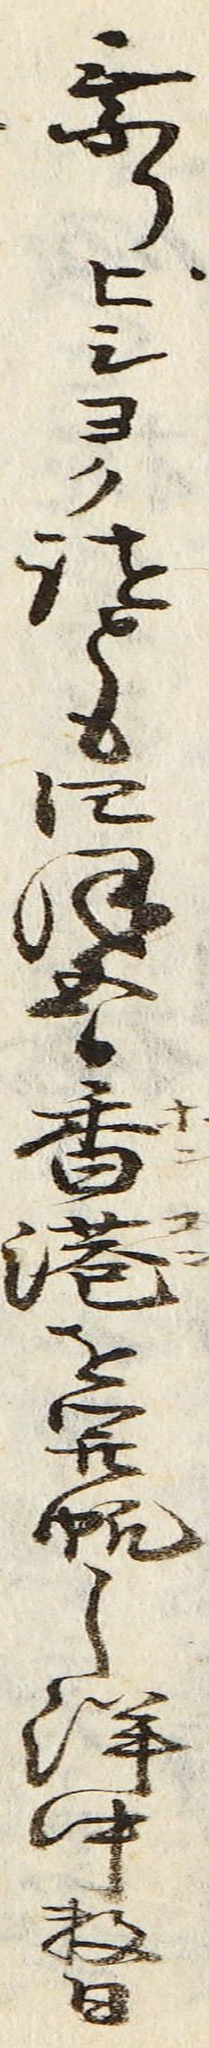乗りビシヨク諸とも四月五日香港を開帆し洋中数日
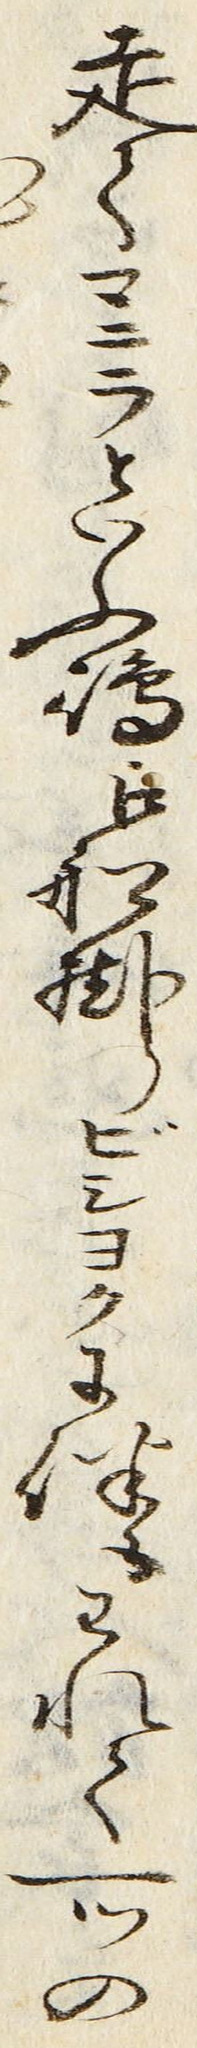走てマニラといふ島え船掛りビシヨクに伴もわれて一ツの
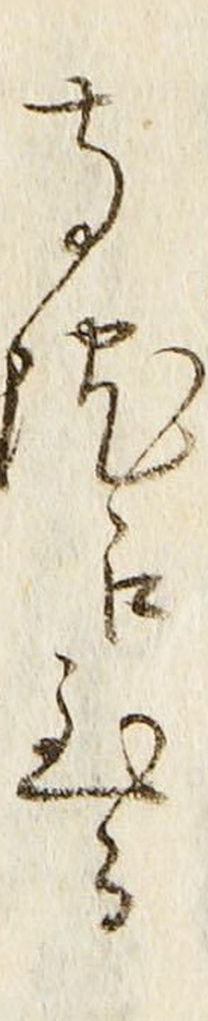寺院え至る
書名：亜墨利加漂流記聞
